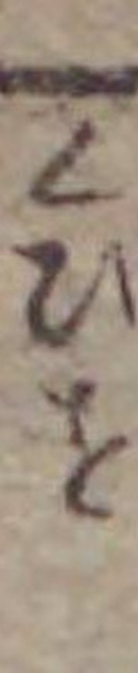くびを
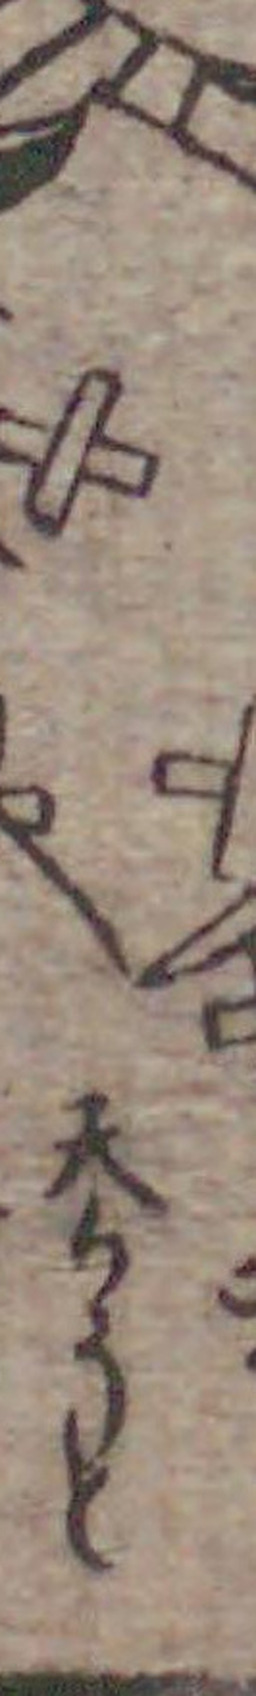天かうと
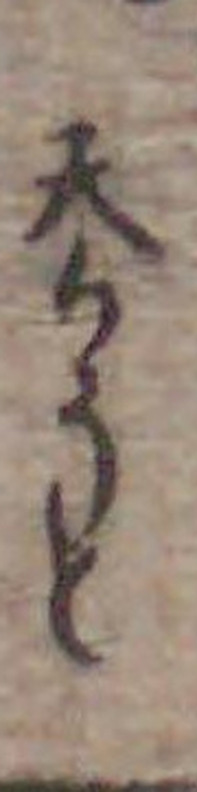天かうと
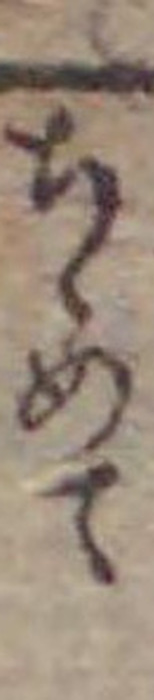ちゝめて
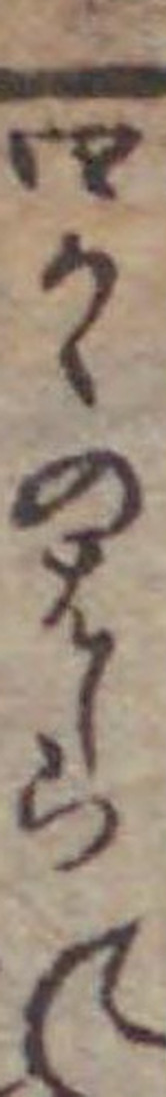四かくのはしら
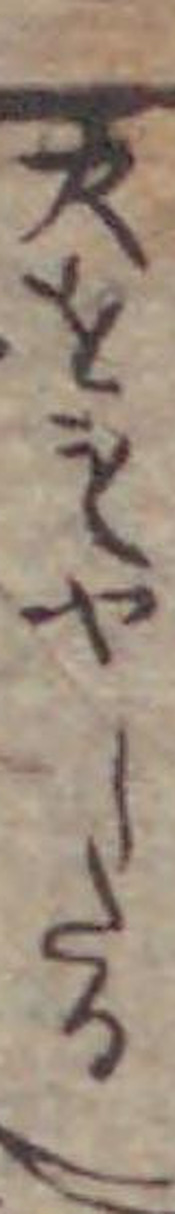火をもやしたる
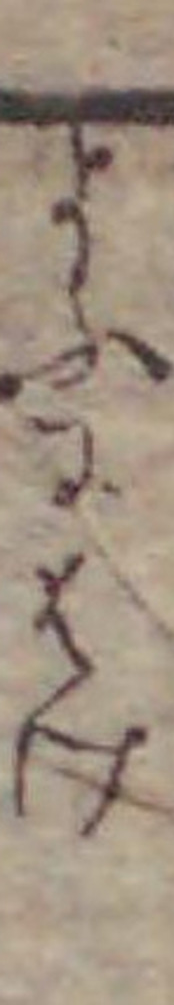よふにはけ
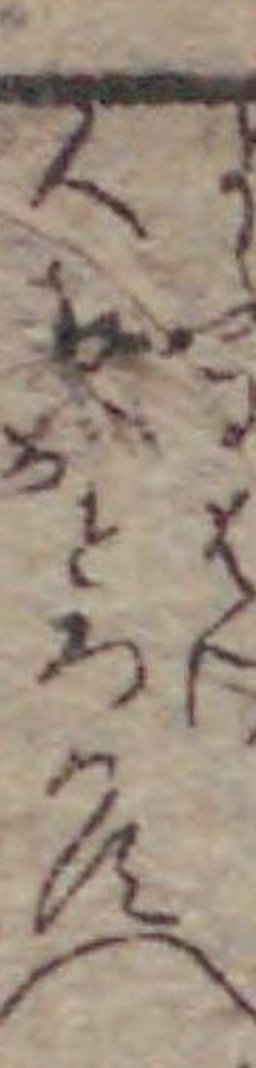人おとろかす
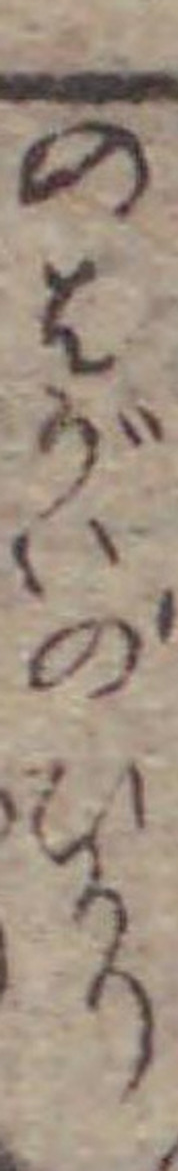のはがいのひかり

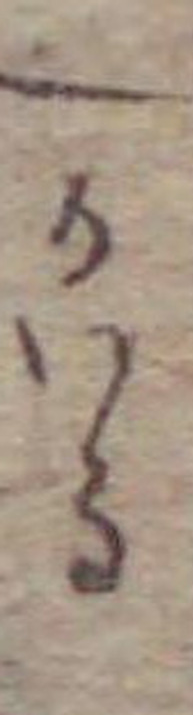かいる
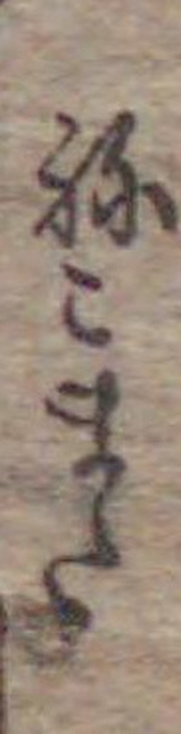ねこまた
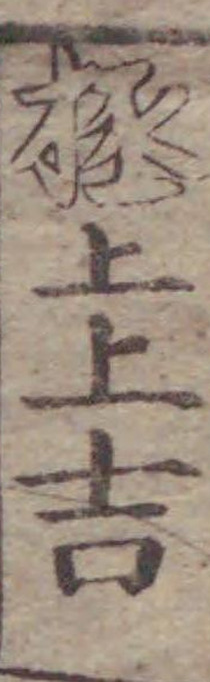㭬上上吉
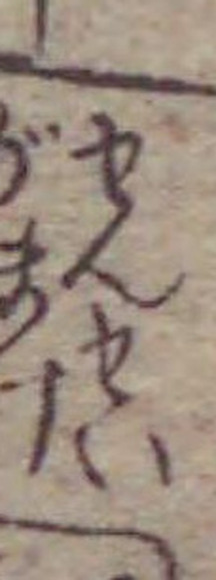がまけ
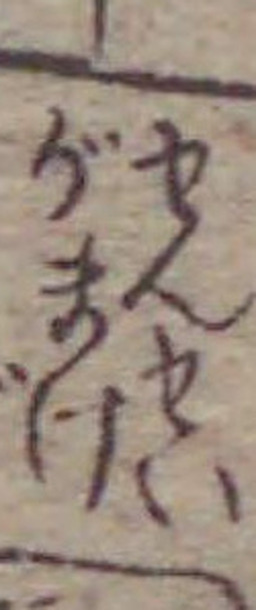がまけ
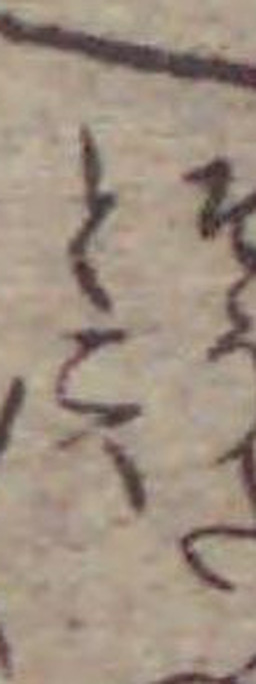とこへ
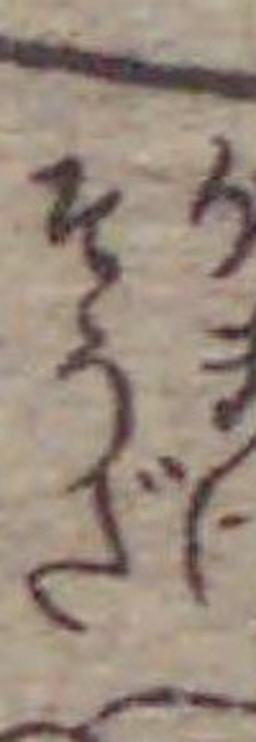そうだ
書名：妖怪仕内評判記 : 2巻
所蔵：国立国会図書館 National Diet Library, JAPAN
